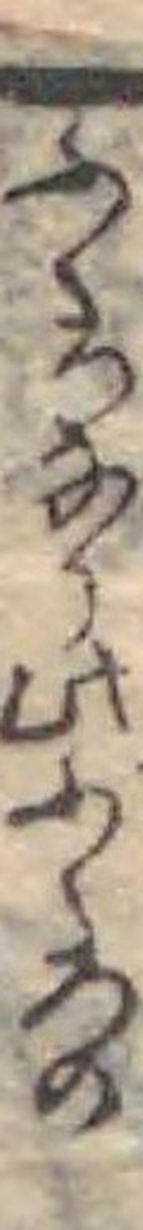ふくろなり此ふくろの
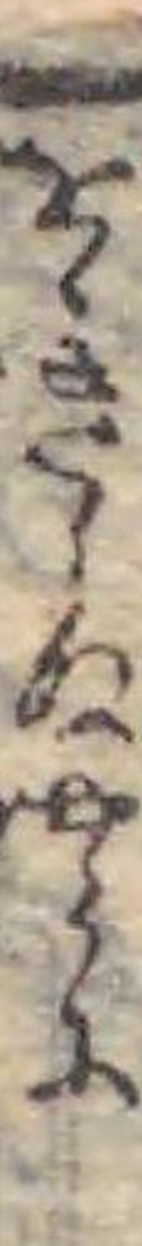をゝきらぬやうに
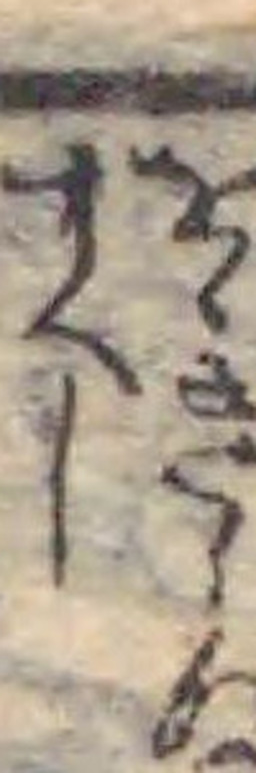すへし
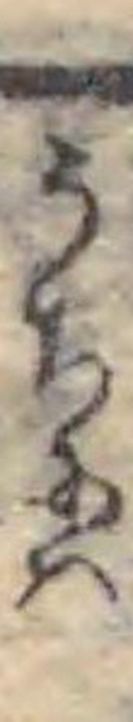うちには
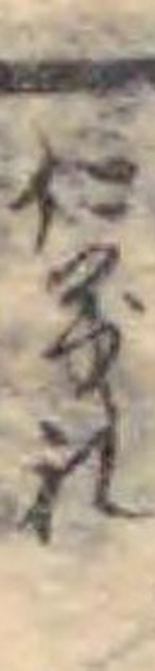仁義れ
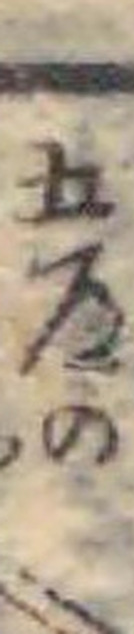五道の
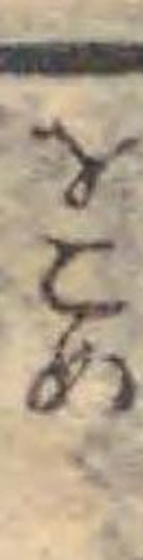をこめ
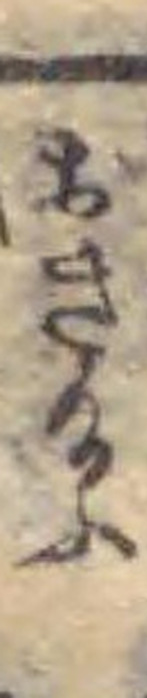おき給ふ
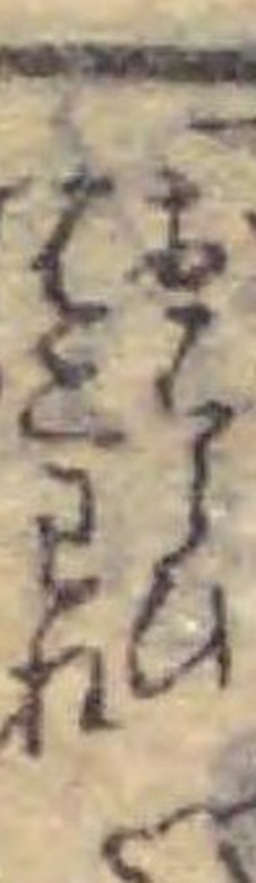はこわれ
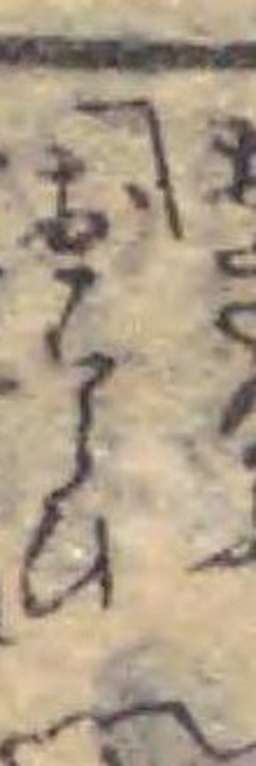〽おはらひ
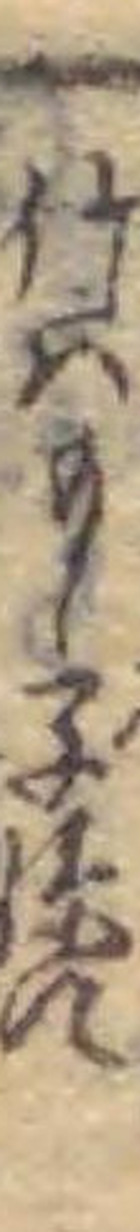竹はもし子孫に
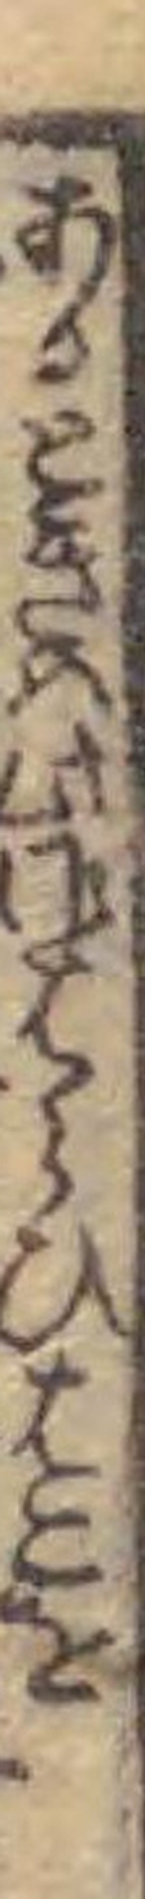あるときは此御はらひはこを
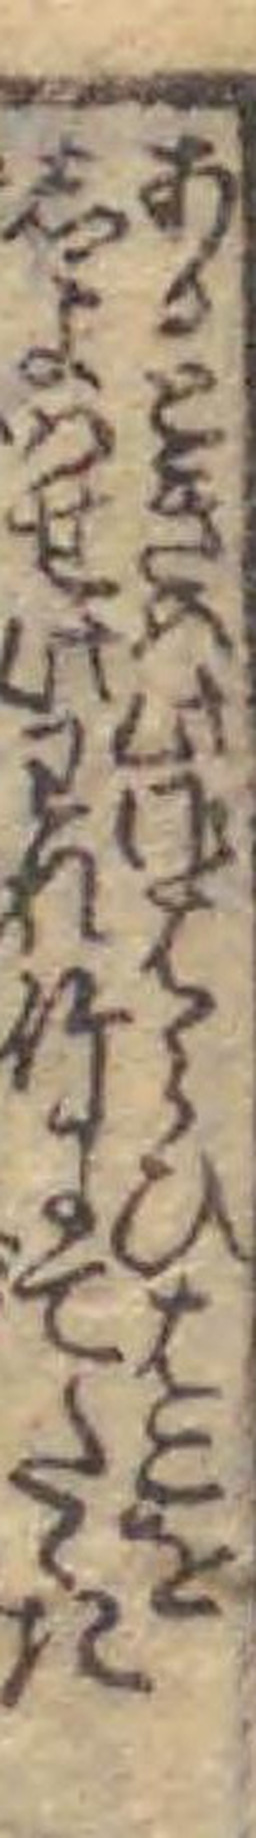しよはせ此われ竹にてたゝき
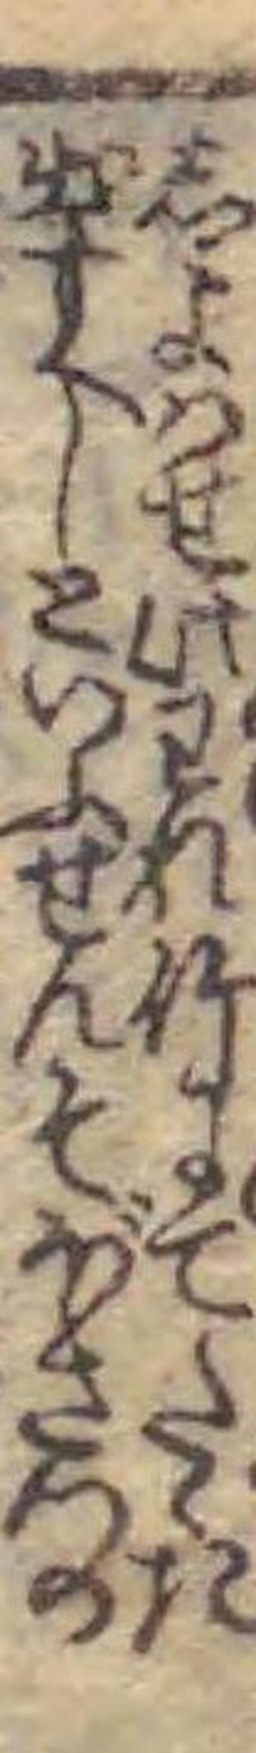出すへしといふせんそぼさつの
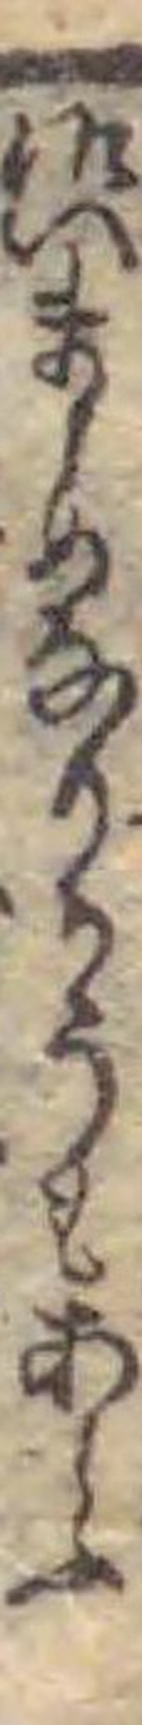御いましめなりかうもあらふ
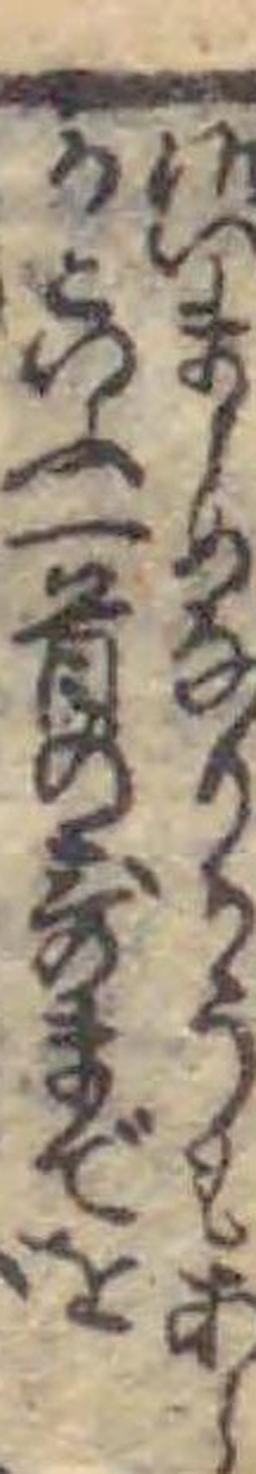かといふ一首の哥までを
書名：身体開帳略縁起 : 3巻
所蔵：国立国会図書館 National Diet Library, JAPAN
